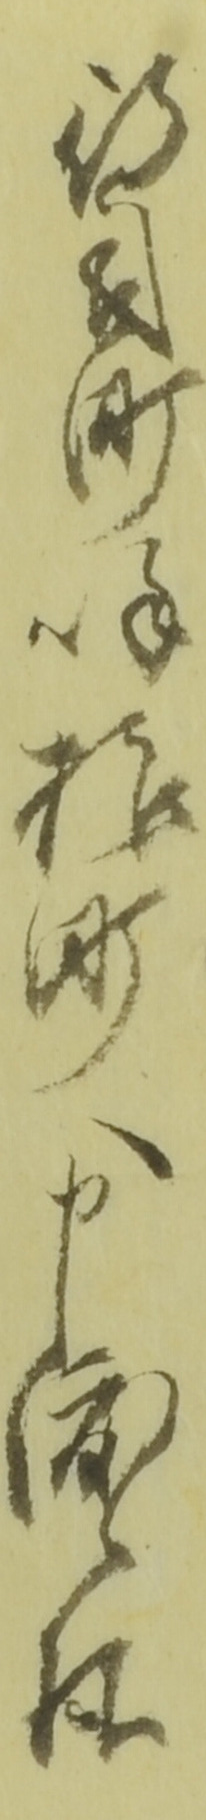行司町呼拾町へ申渡候様
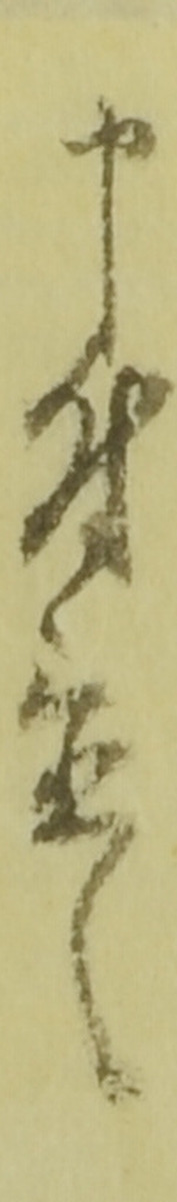申付置候
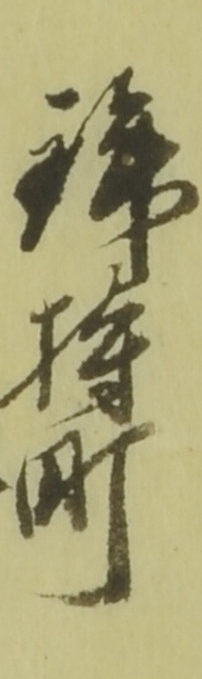鉾持町
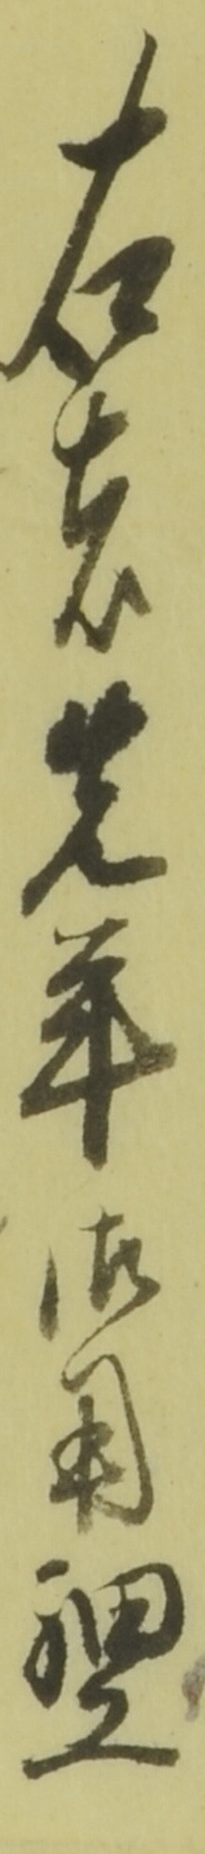右は先年御用細工
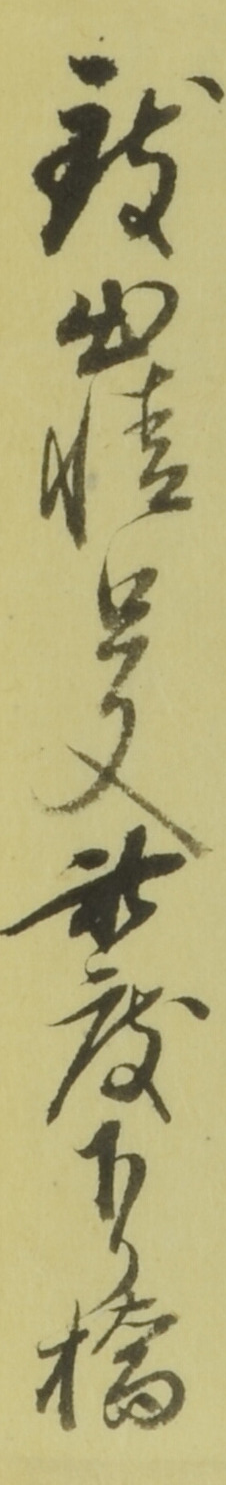致出精且又此度下り橋
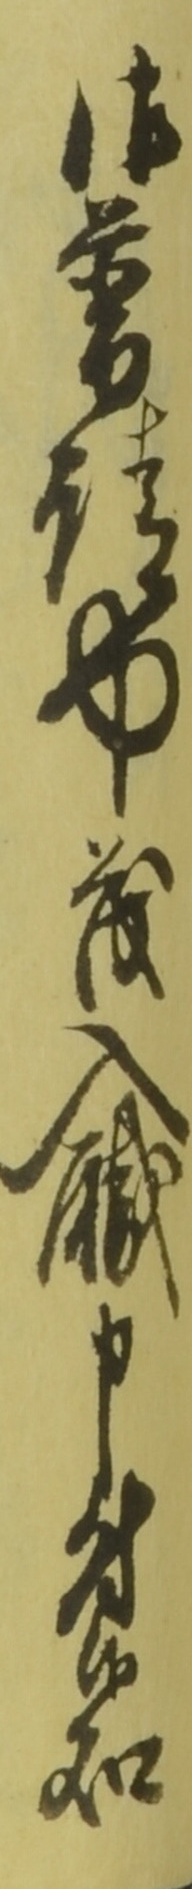御普請中も入職申付候処
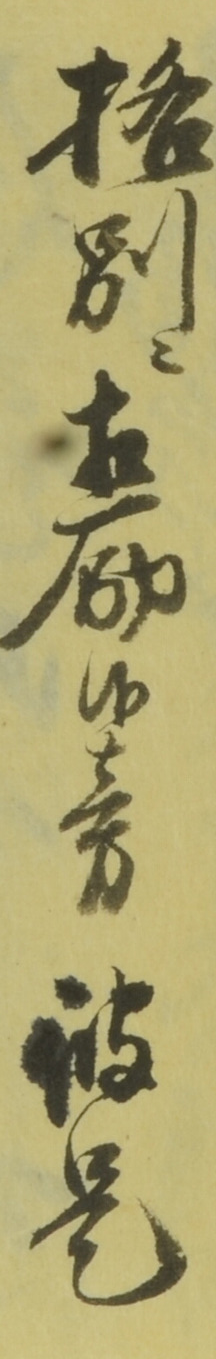格別ニ相励候旁彼是
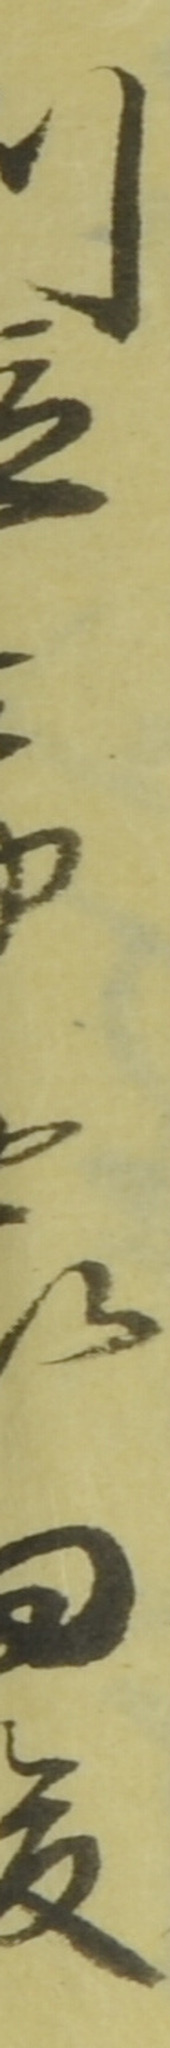別段之筋を以向後

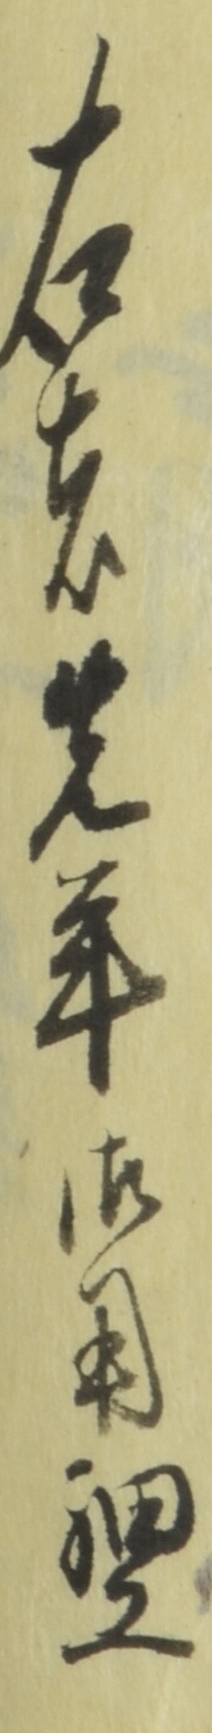右は先年御用細工
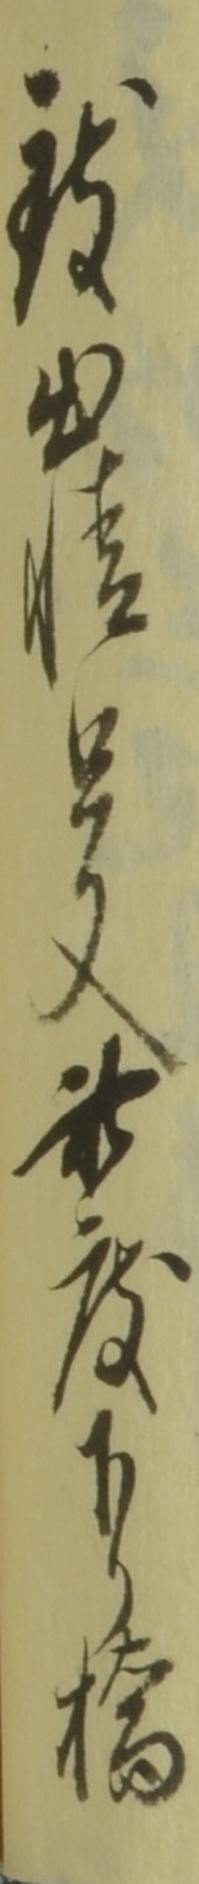致出精且又此度下り橋
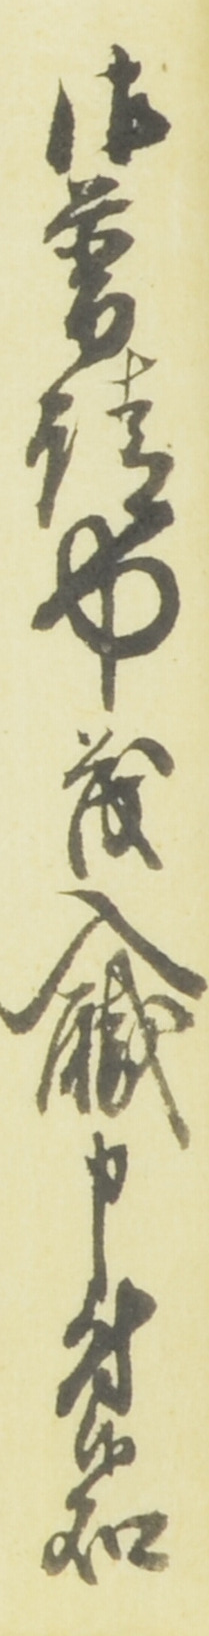御普請中も入職申付候処
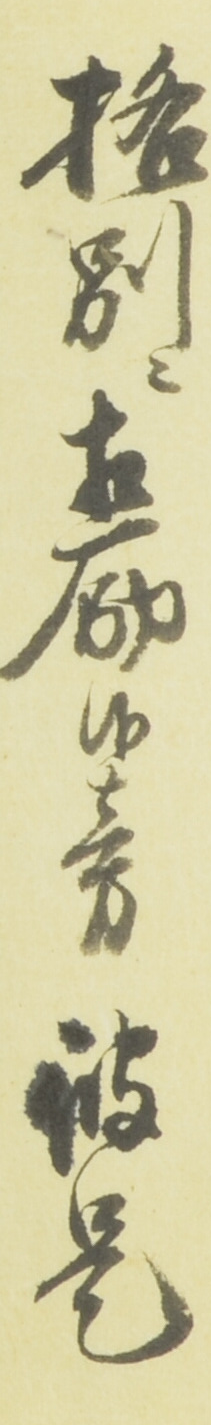格別ニ相励候旁彼是
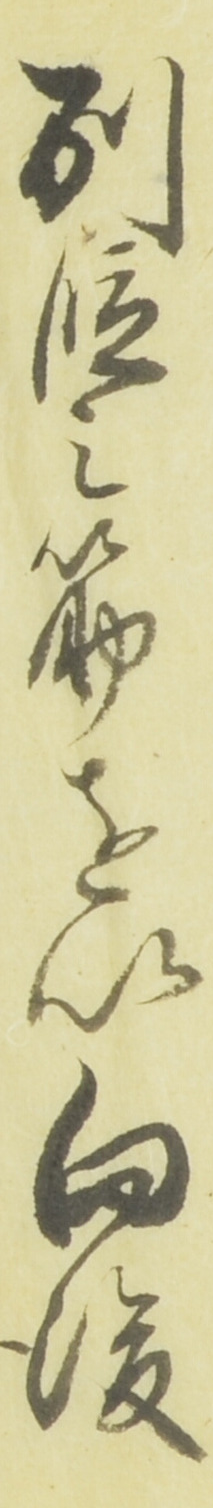別段之筋を以向後
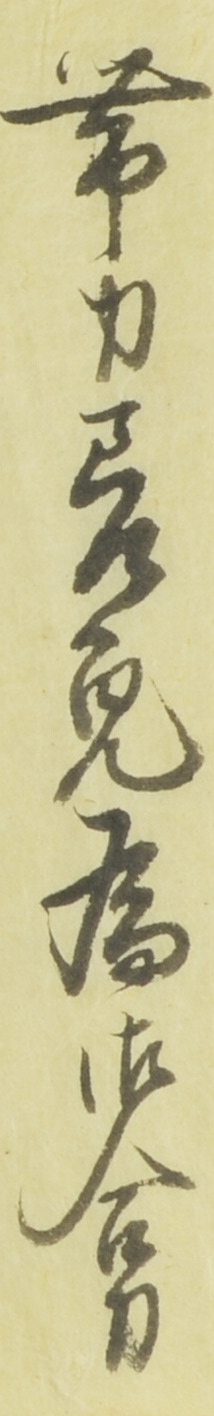帯刀差免為御合力
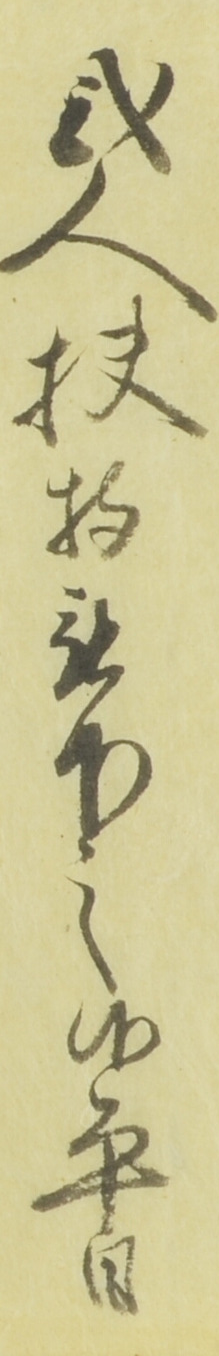弐人扶持被下之候平自
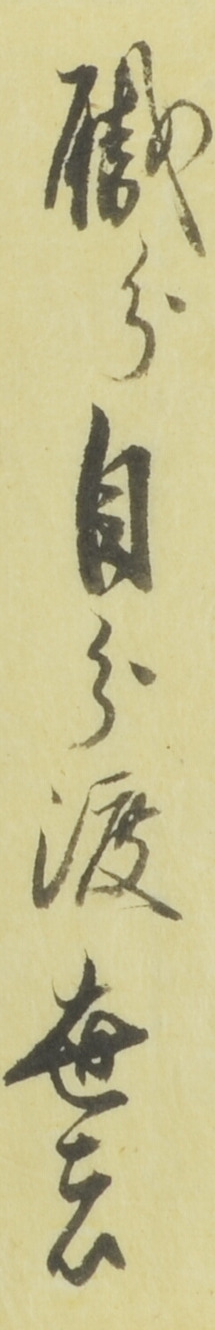職分自分渡世は
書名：御触書御書附控
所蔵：伊那市立高遠町図書館・合同会社AMANE
